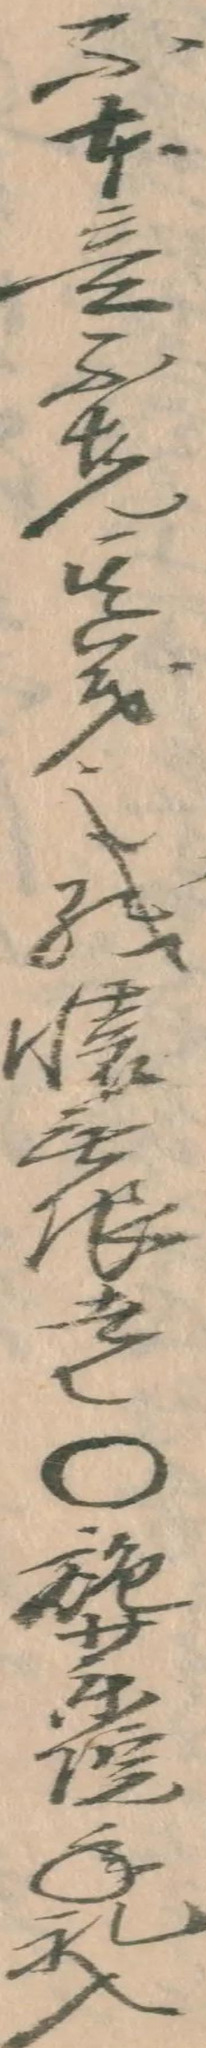不本意不存心其義之残懐無限云々○施薬院年礼入
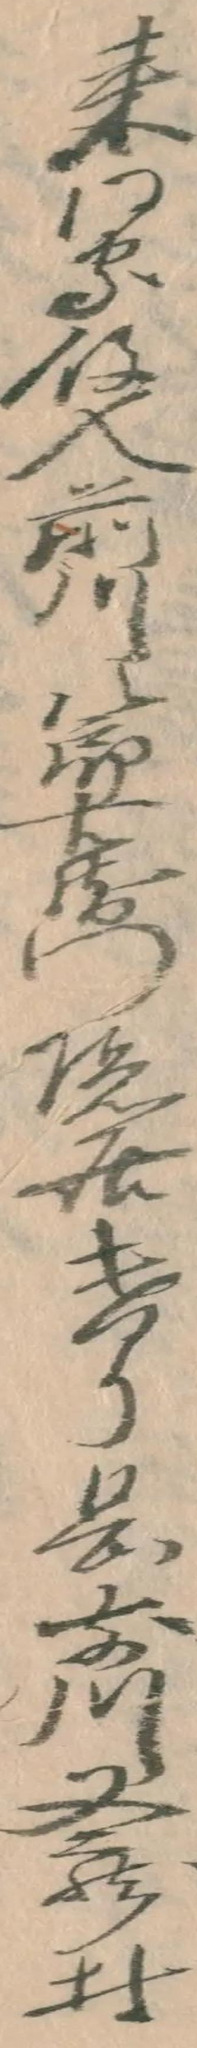来同家役人前川八郎右衛門隠居遣り息前川又蔵村
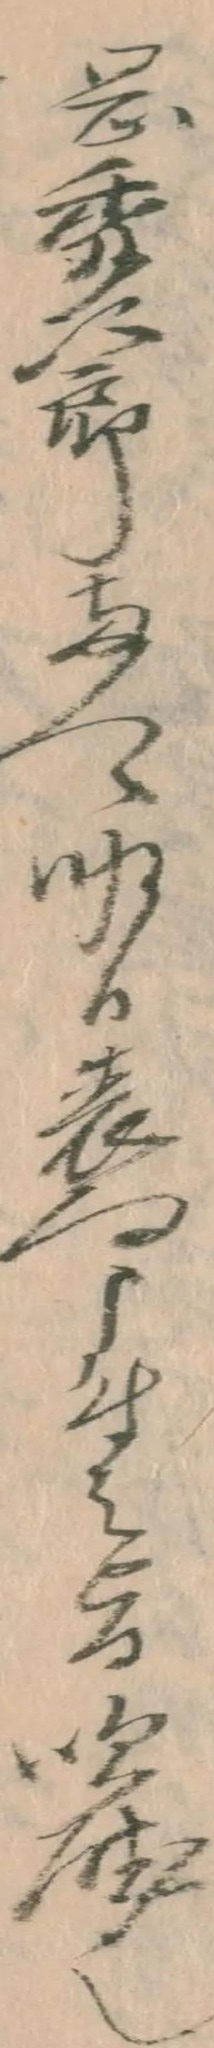岡秀次郎両人へ明日表向申付之旨吹聴也
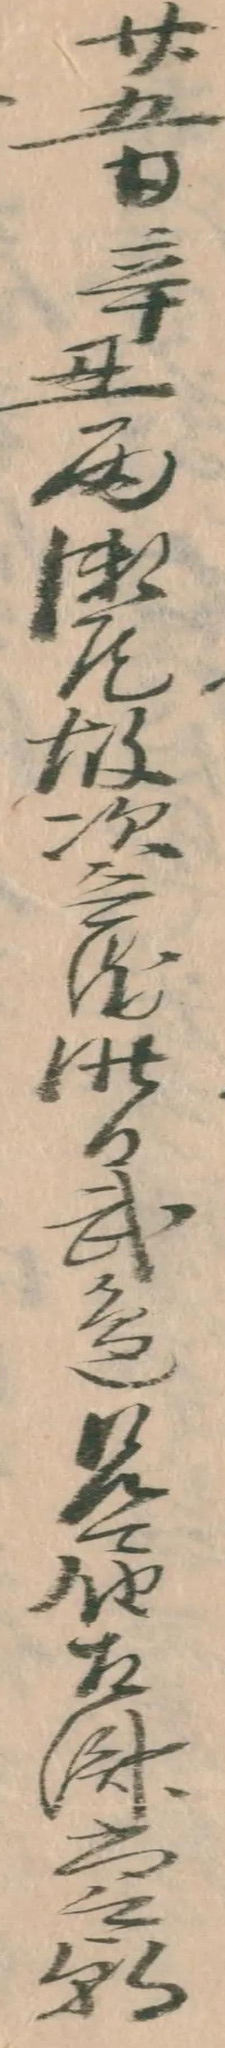廿五日辛丑雨瀬尾故次兵衛昨日武邊見届相済尚今朝
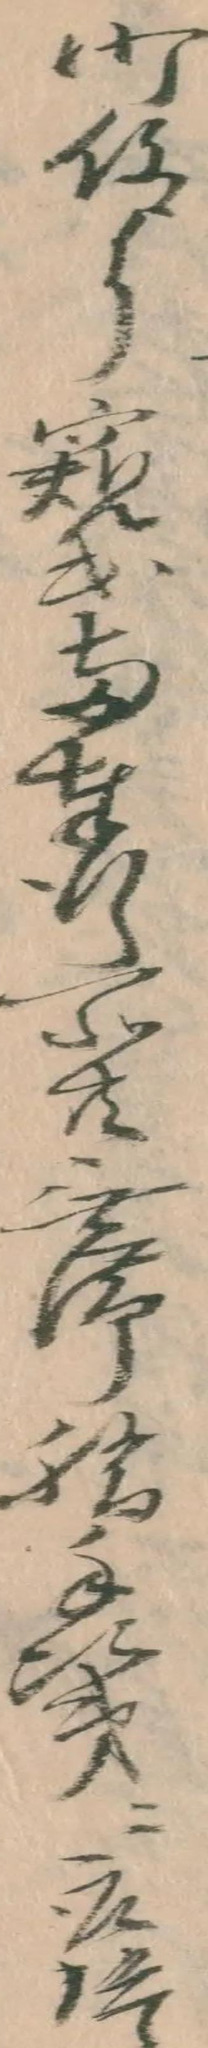御役より窺義両奉行所共無滞勝手次第二取片
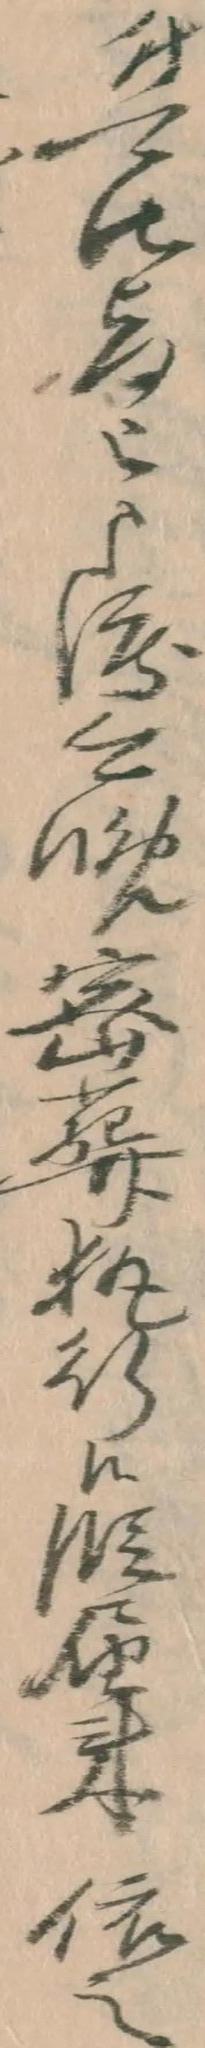付可仕旨被申渡今晩密葬執行候假届来依之
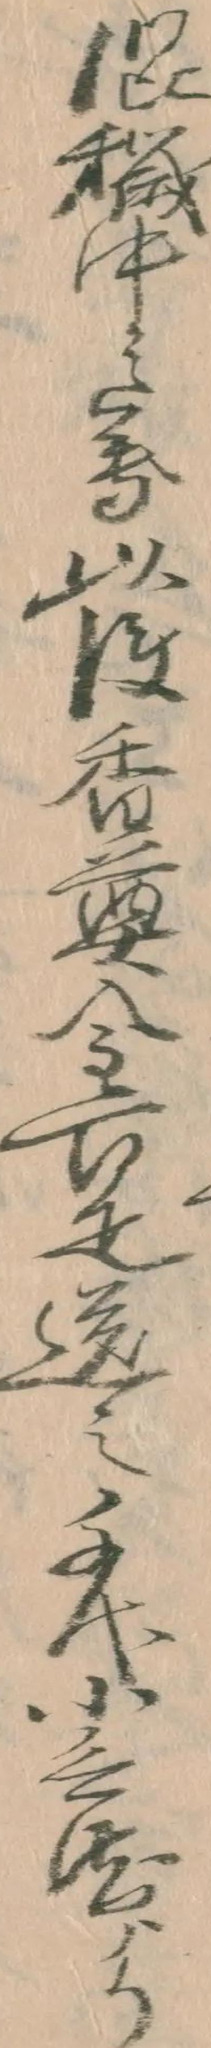混穢中之被以後香奠金百疋送之手代小兵衛より
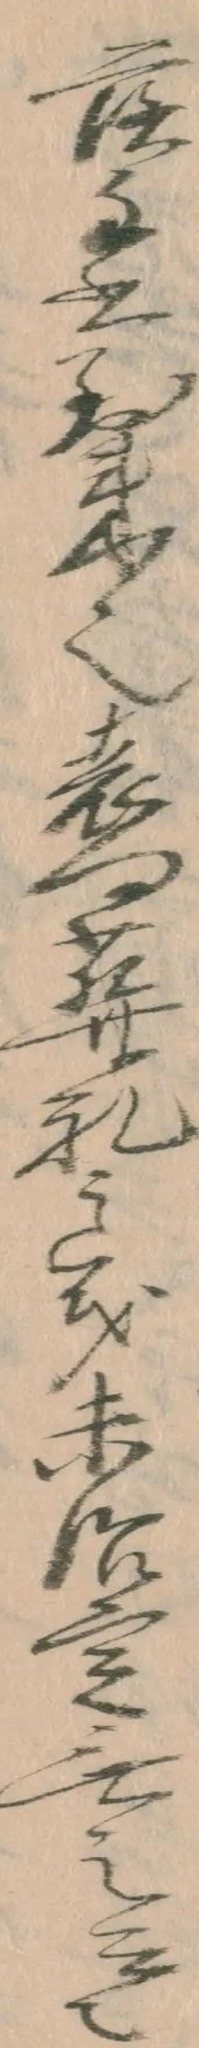庄手書到来也表向葬礼之義未治定無之云〻
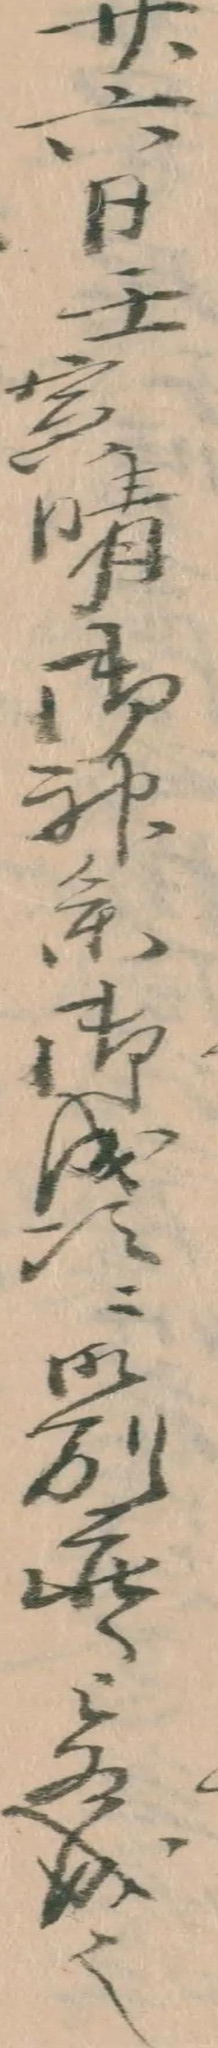廿六日壬寅晴御神楽御頭二御別荘へ被為成候
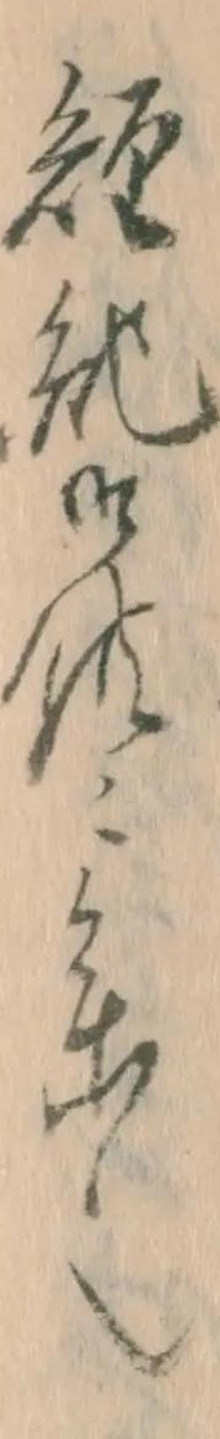経紀御供ニ参也
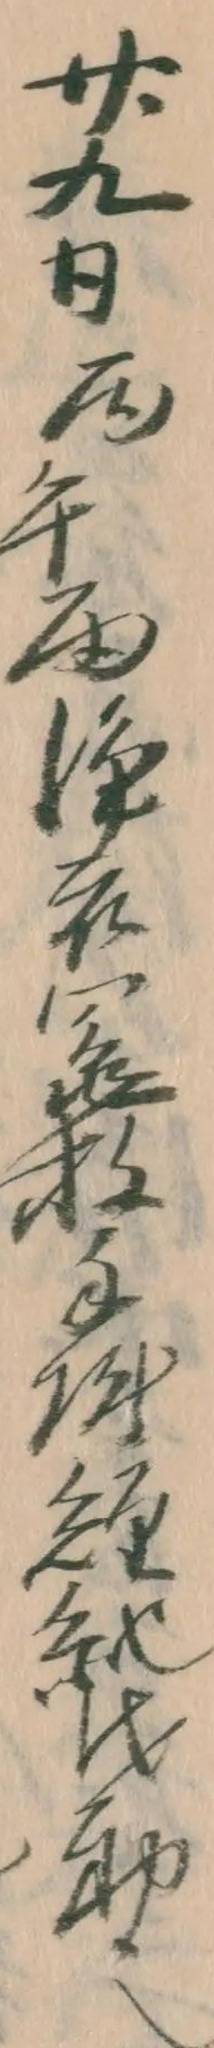廿九日丙午雨浄衣鬮毎手附経紀代勤也
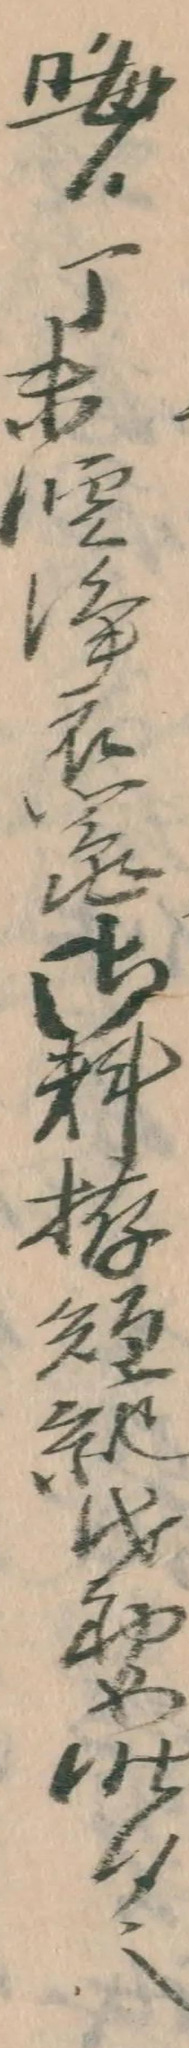晦日丁未曇浄衣鬮御料拵経紀代勤め如昨日也
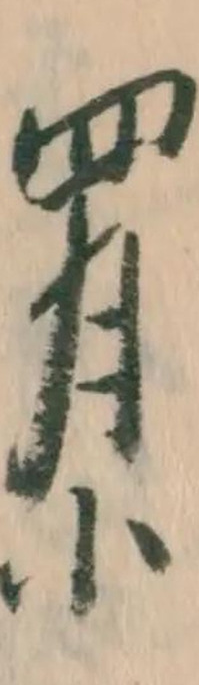四月小
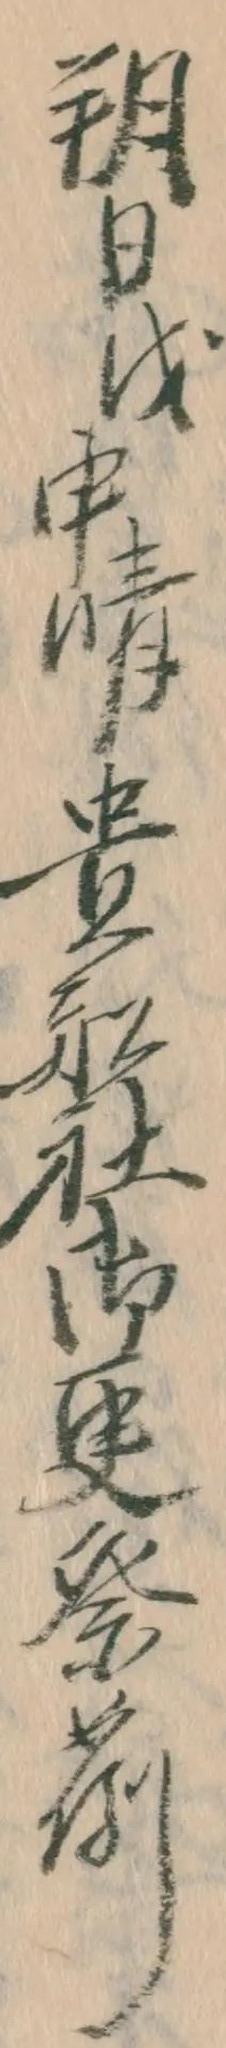朔日戊申晴貴舩社御更祭如例
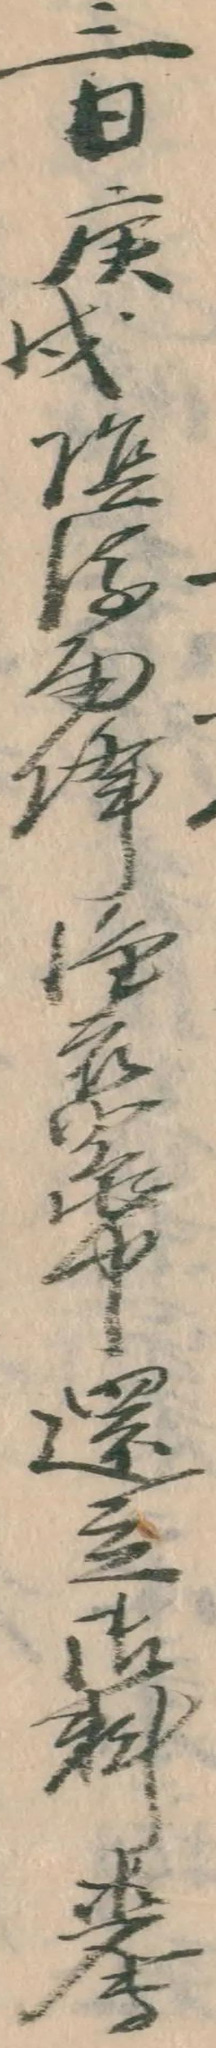三日庚戌陰後雨降浄衣鬮中還立御料直會
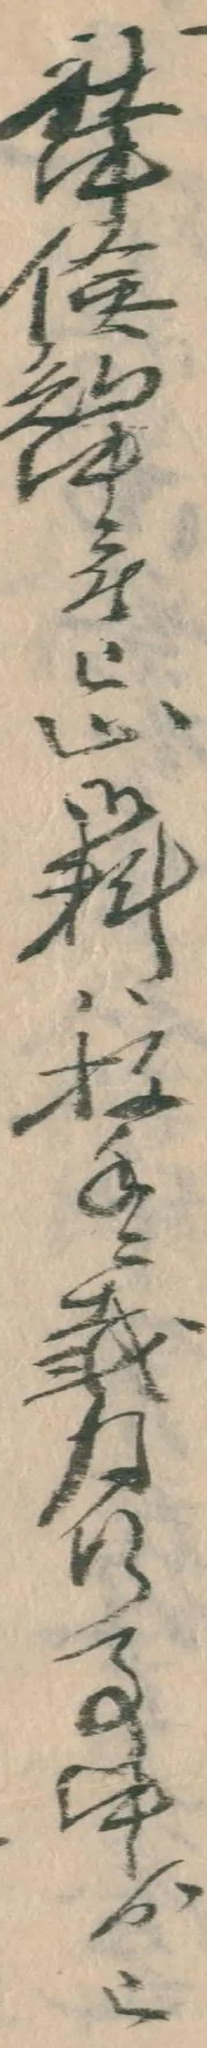社中倹約中ニ付被山御料ハ枚手ニ裁月行事中ゟ被
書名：賀茂社記録. 第67冊
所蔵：国立国会図書館 National Diet Library, JAPAN
